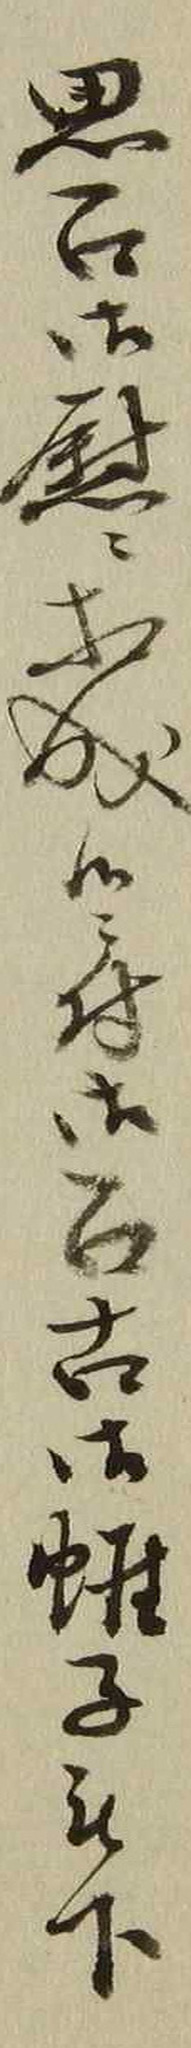思召御慰ニ相成候ニ付御召古御帷子被下
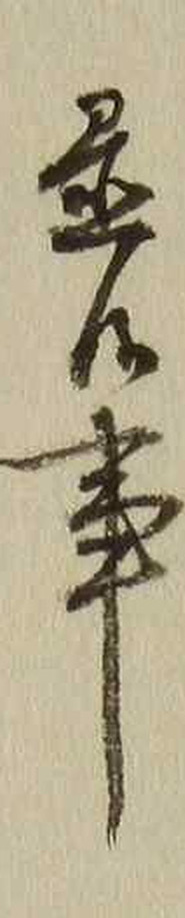置候事
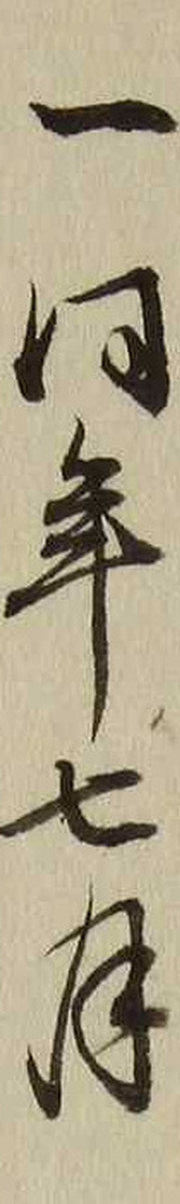一同年七月
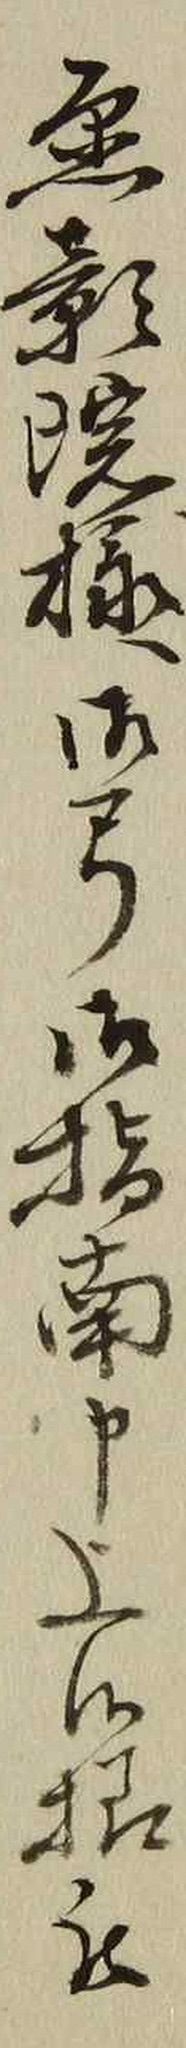愿彰院様へ御弓御指南申上候様被
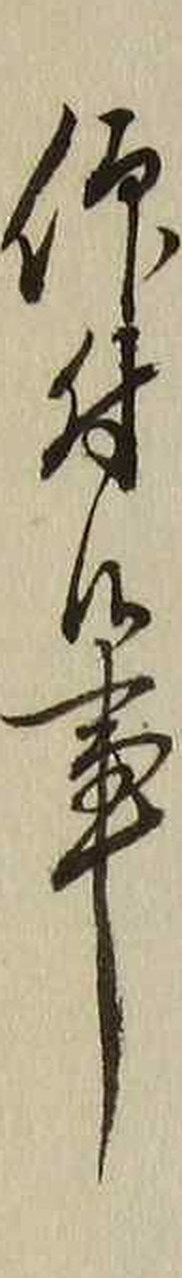仰付候事
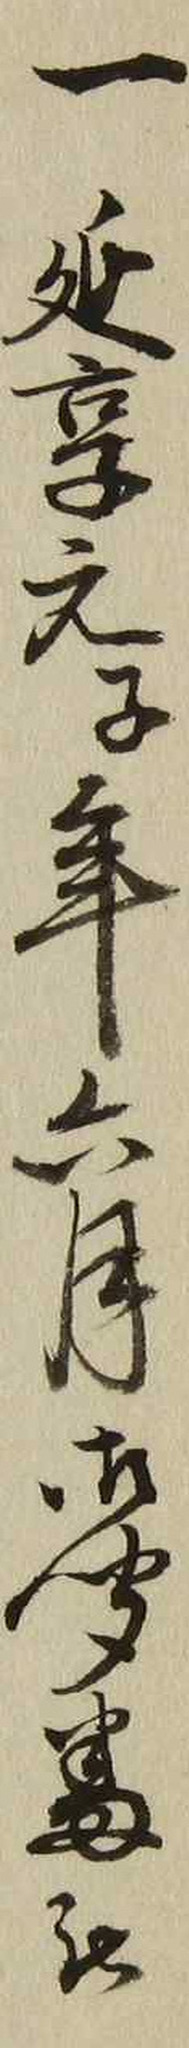一延享元子年六月御聞番被
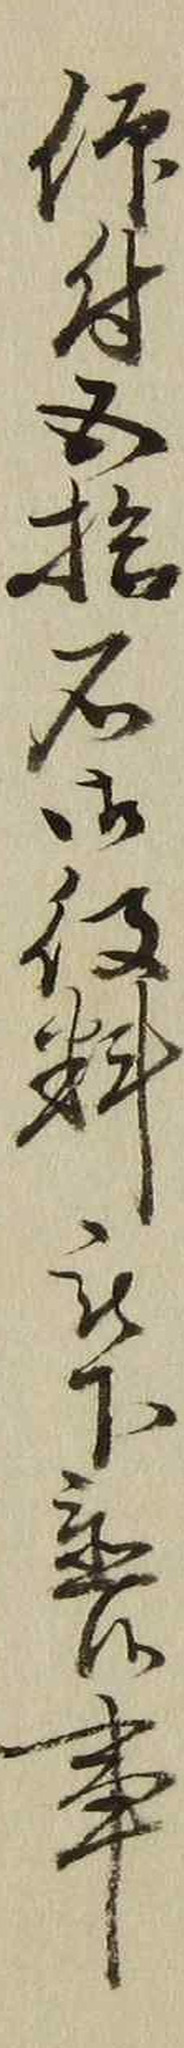仰付五拾石御役料被下置候事
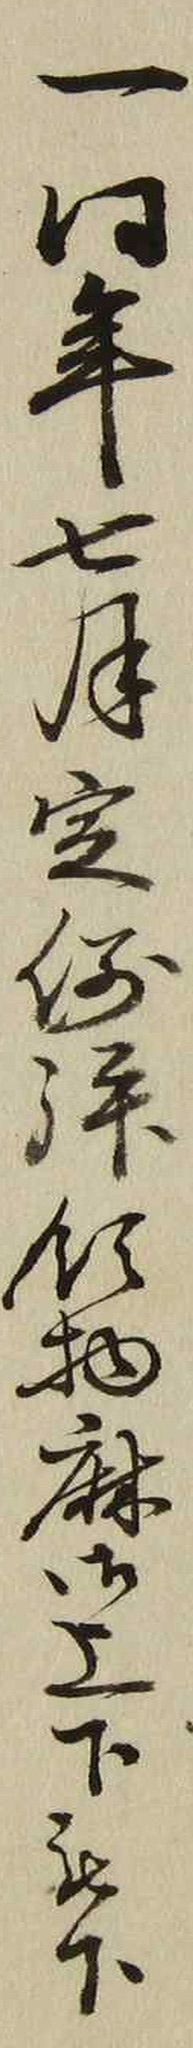一同年七月定例拝領物麻御上下被下
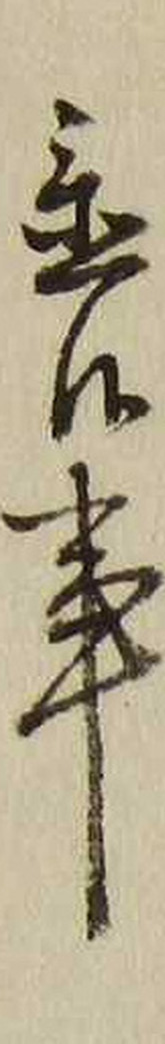置候事
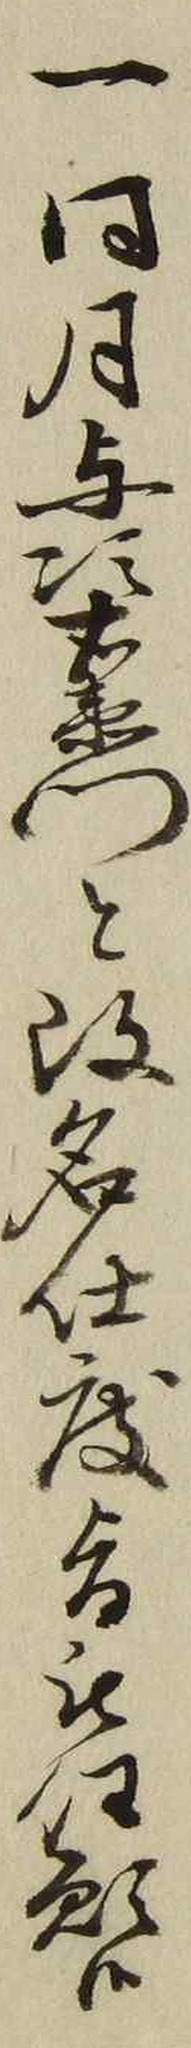一同月与次右衛門と改名仕度旨被任願候

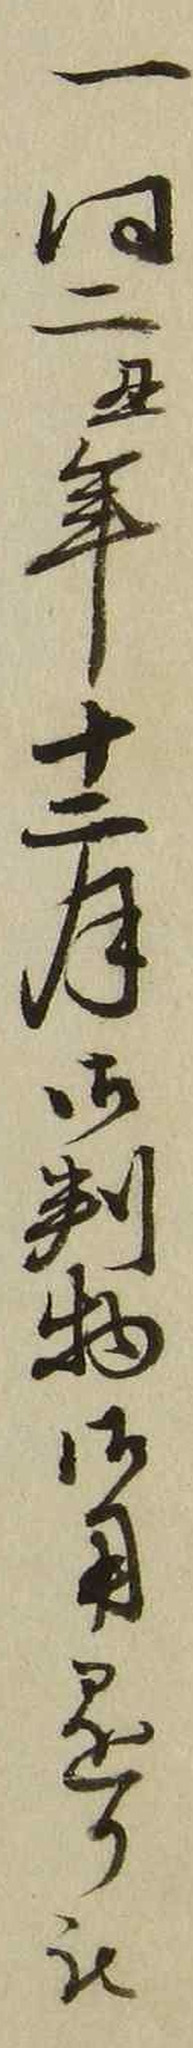一同二丑年十二月御判物御用懸り被
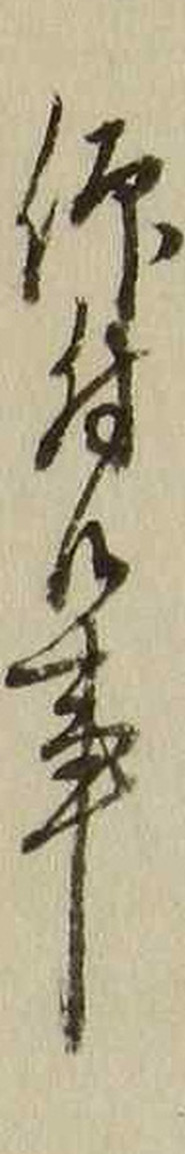仰付候事
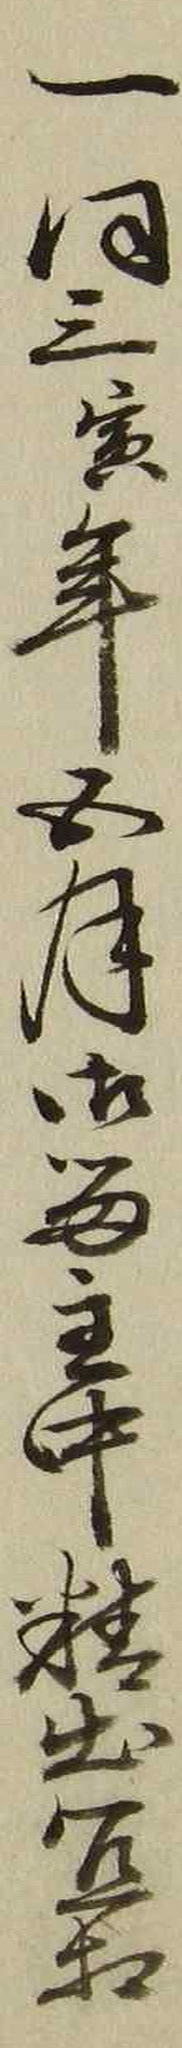一同三寅年五月御留主中精出宜相
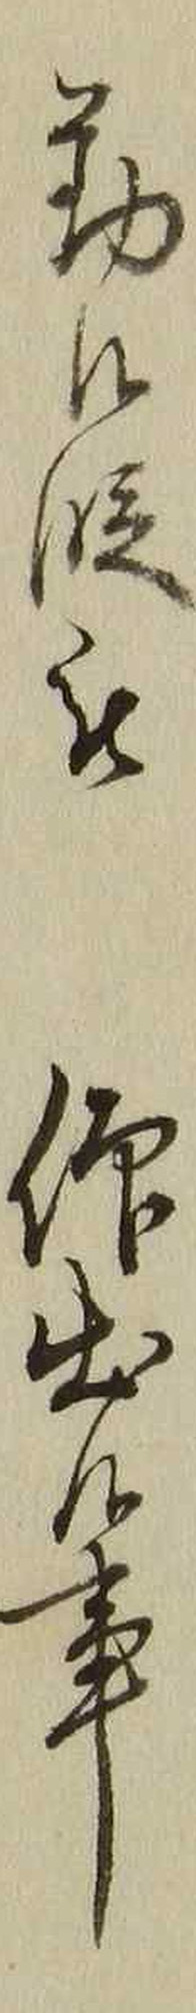勤候段被仰出候事
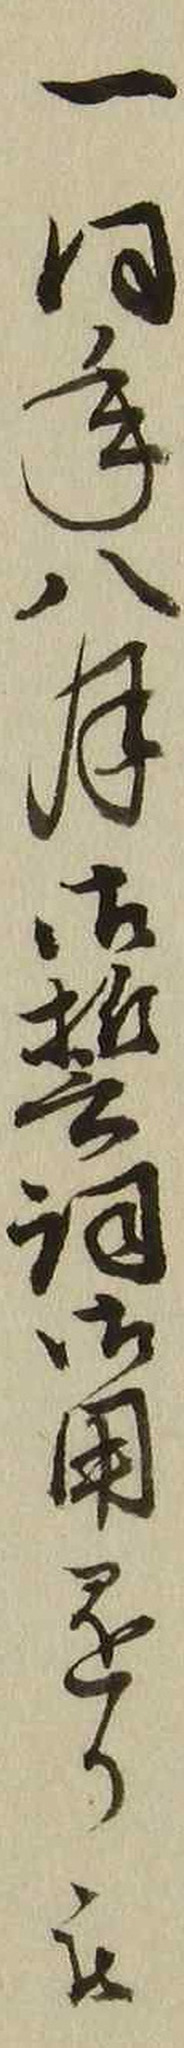一同年八月御誓詞御用懸り被
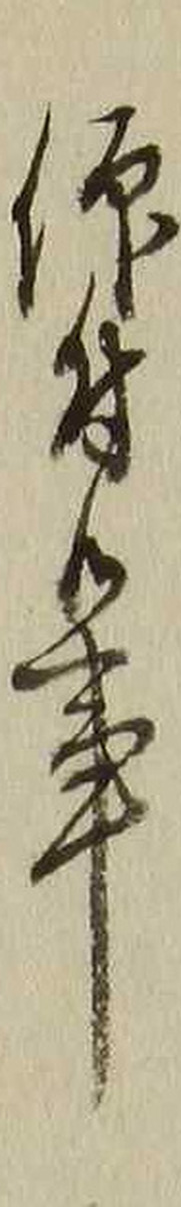仰付候事
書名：諸士系譜　巻之35　は之部3
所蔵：会津若松市立会津図書館
